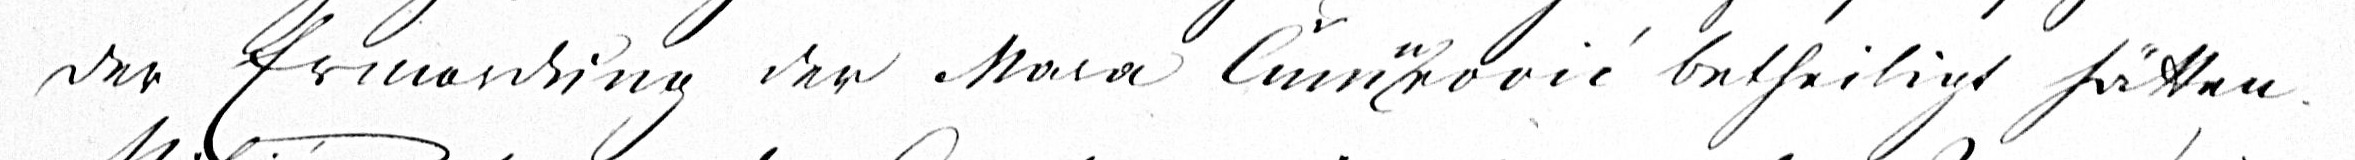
der Ermordung der Mara Cumurović betheiligt hätten.
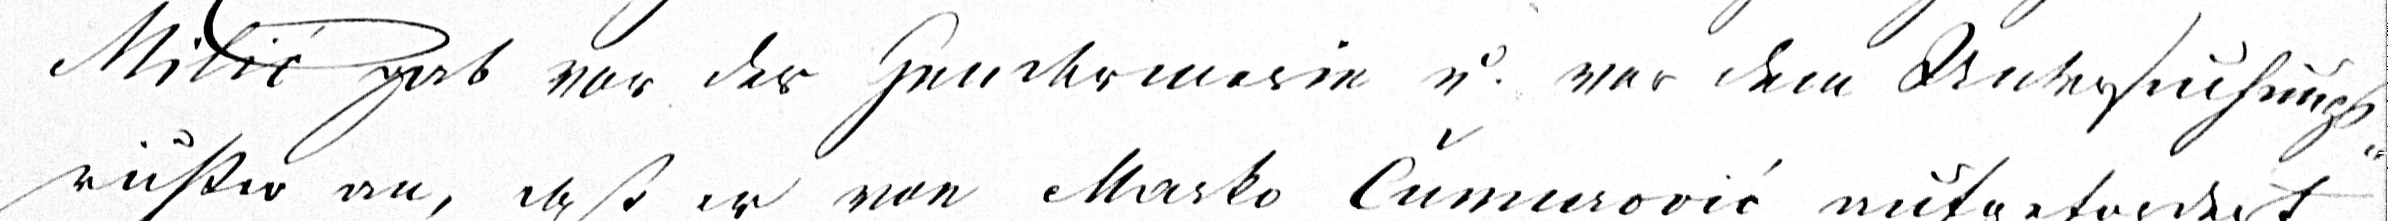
Milić gab vor der Gendarmerie u. vor dem Untersuchungs¬
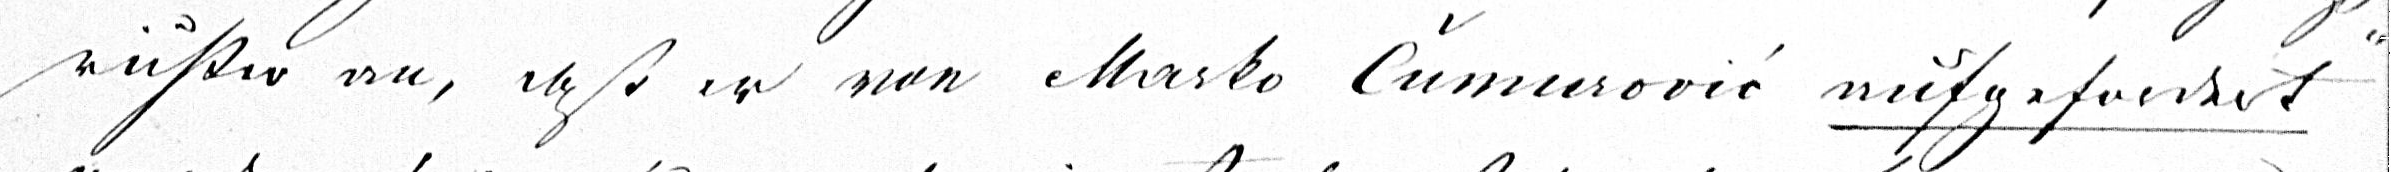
richter an, daß er von Marko Cumurović aufgefordert
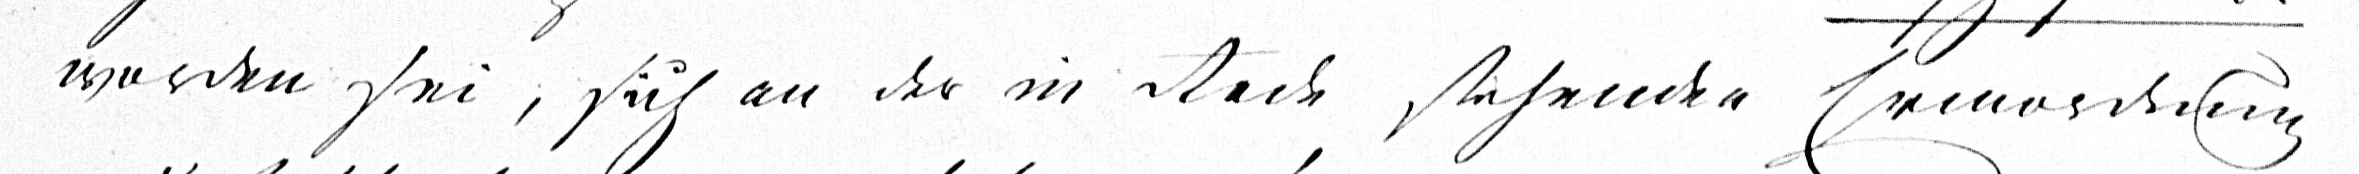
worden sei, sich an der in Rede stehende Ermordung
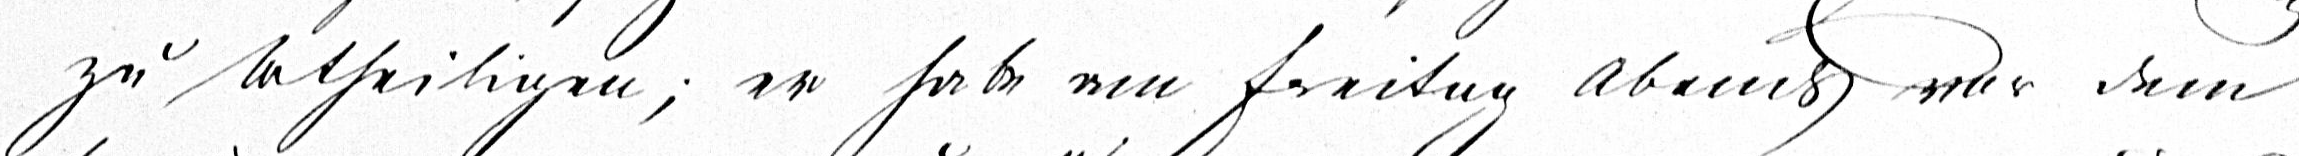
zu betheiligen, er habe am Freitag Abends vor dem
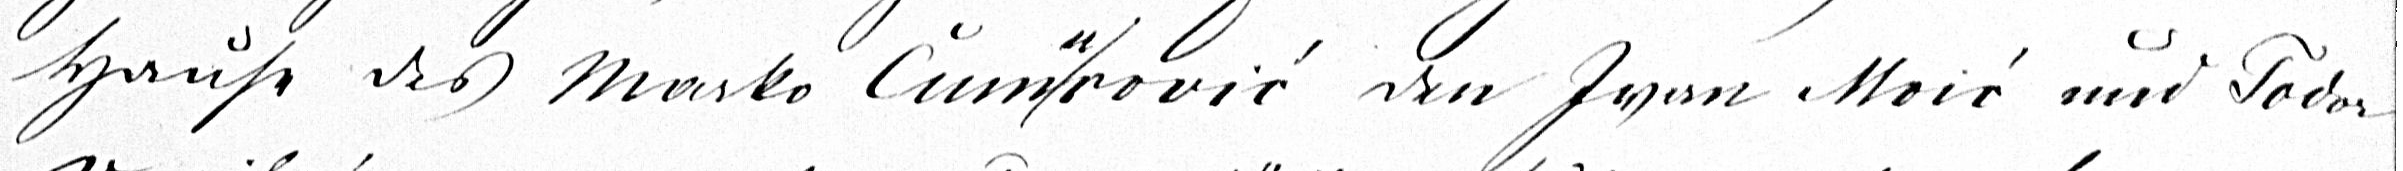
Hause des Marko Cumurović den Ivan Moić und Todor
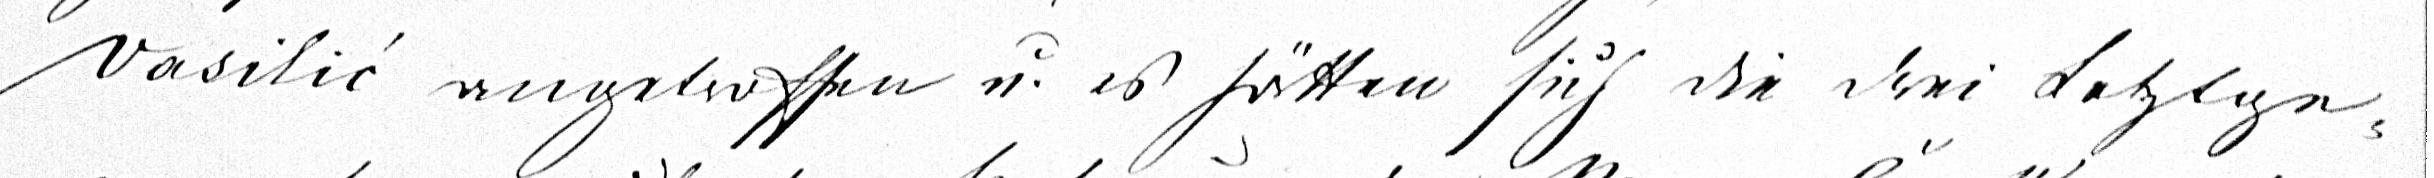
Vasilić angetroffen u. es hätten sich die drei Letztge¬
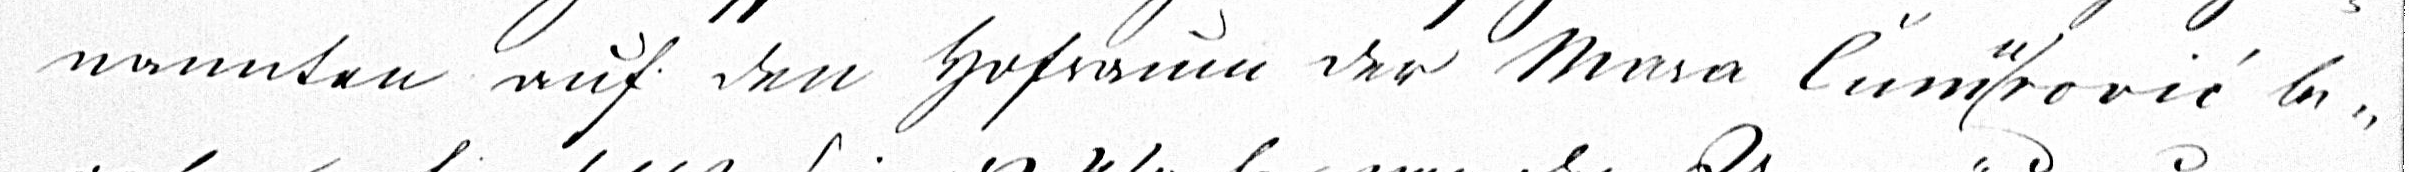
nannten auf den Hofraum der Mara Cumurović be¬
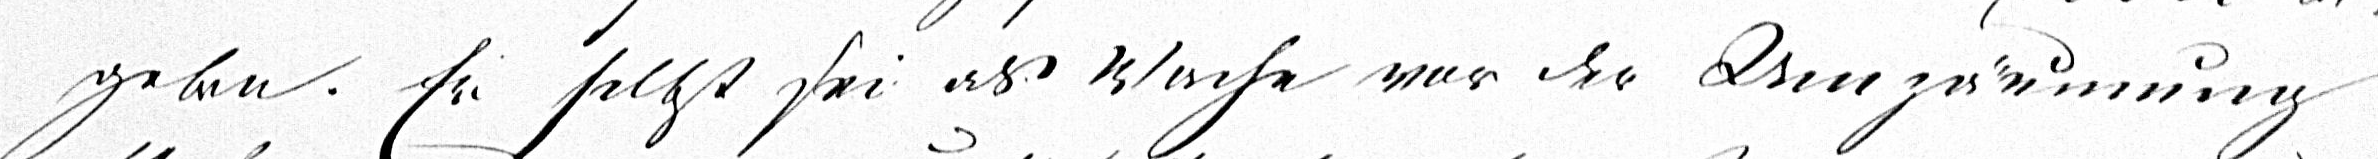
geben. Er selbst sei xx klage vor der Umzäumung
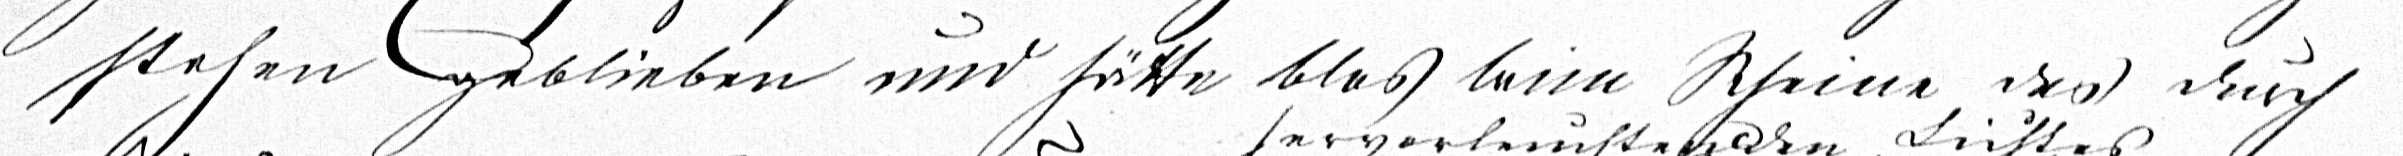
stehen geblieben und hätte blos leim Rheine des durch
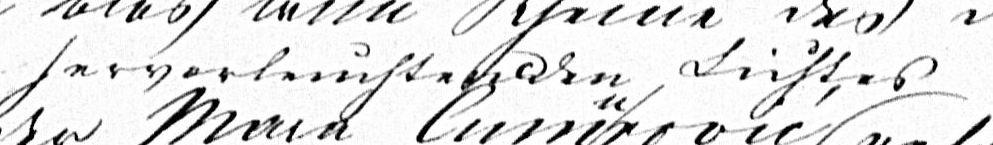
hervorleuchtenden Lichtes
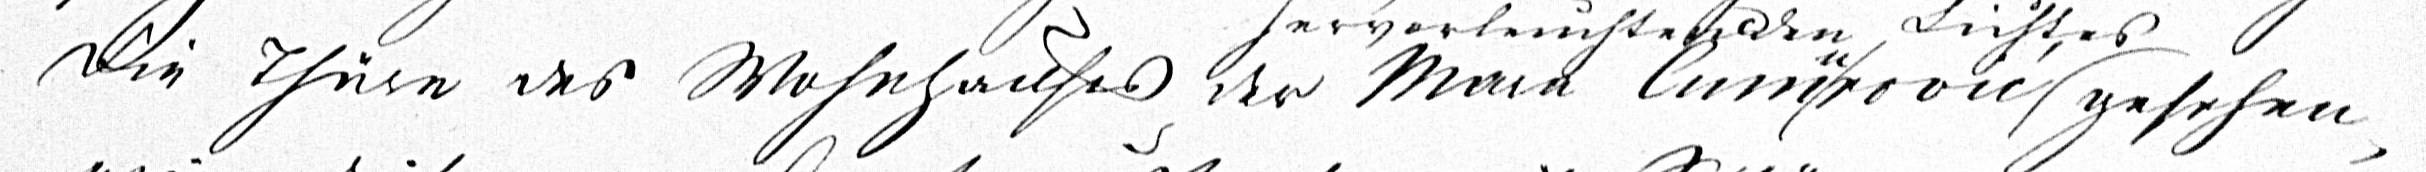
die Thüre des Wohnhauses der Mara Cumurović gesehen,
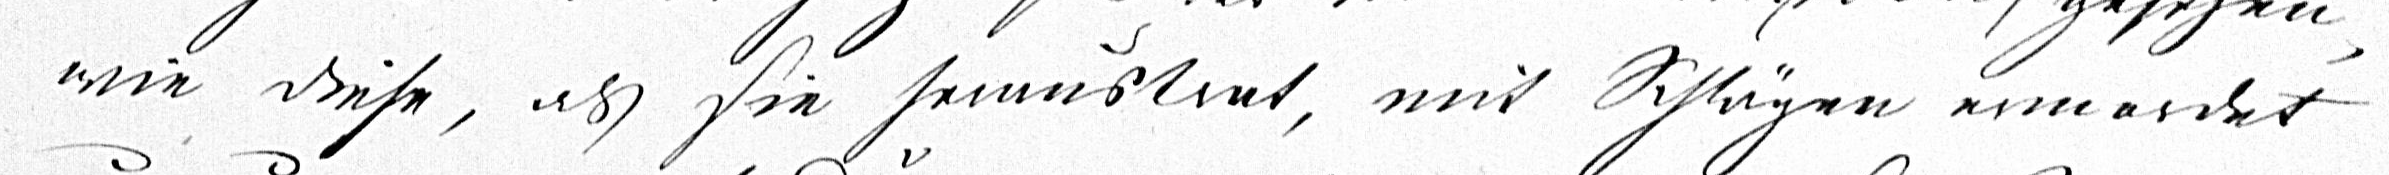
wie diese, als sie heraustrat, mit Schlägen ermordet
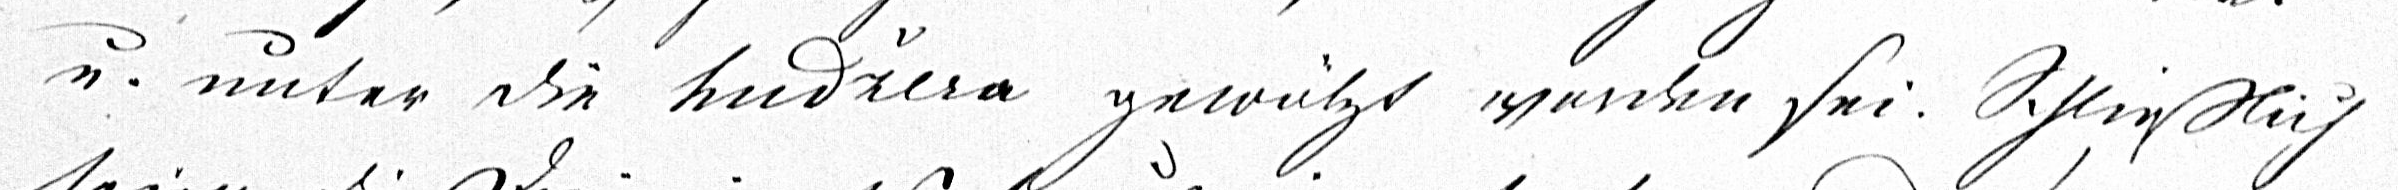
u. unter die hudžera gewälzt worden sei. Schließlich
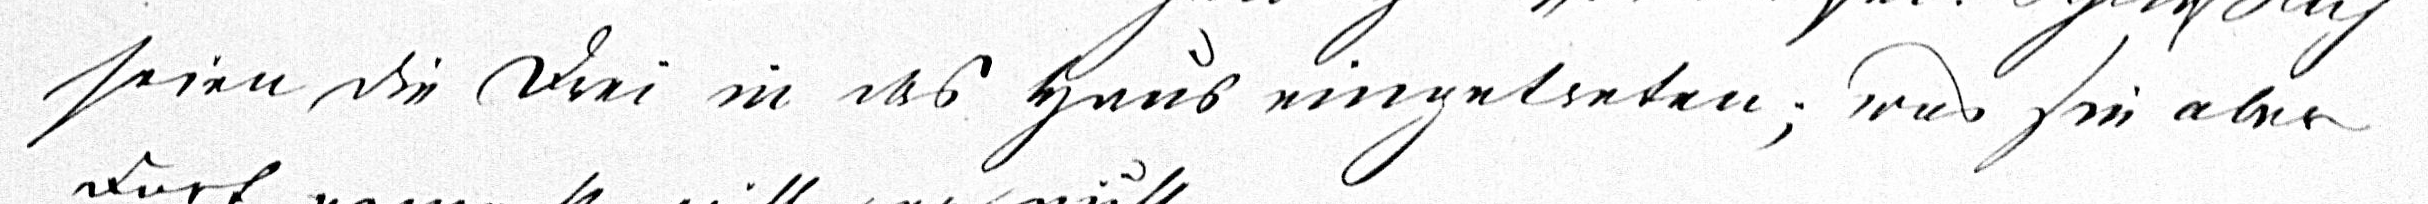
seien die Drei in das Haus eingetreten; was sie aber
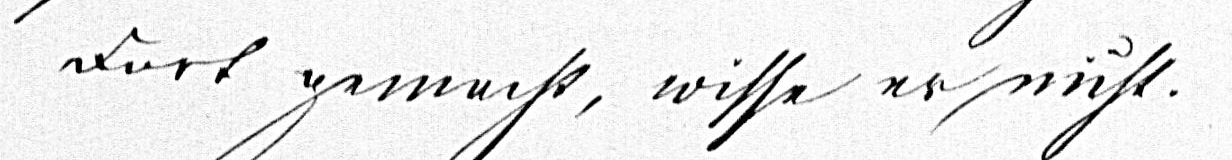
Fort gemacht, wisse er nicht.
